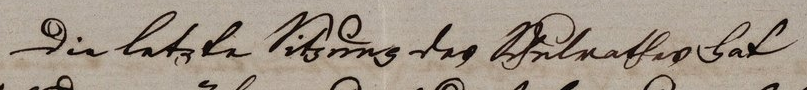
Die letzte Sitzung des Schulrathes hat
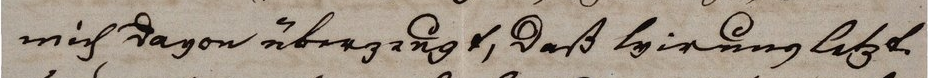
mich davon überzeugt, daß wir uns letzt-
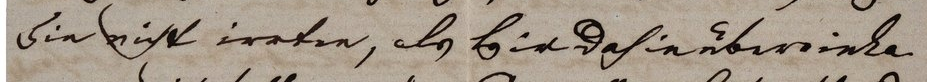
hin nicht irrten, als wir dahin übereinka-
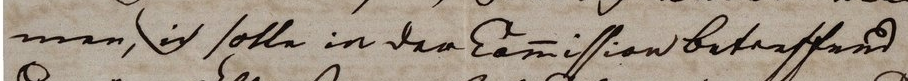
men, ich sollte in der Commission betreffend
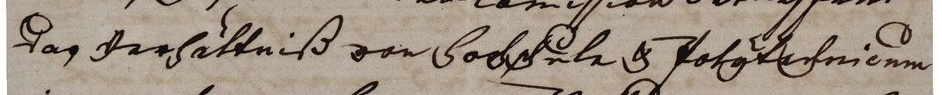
das Verhältniß von Hochschule & Polytechnicum
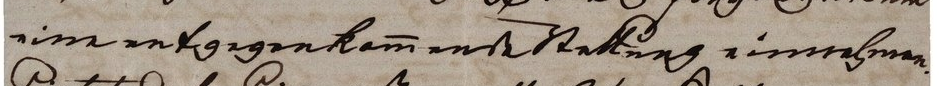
eine entgegenkommende Stellung einnehmen.
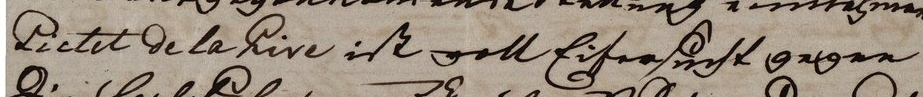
Pictet de la Rive ist voll Eifersucht gegen
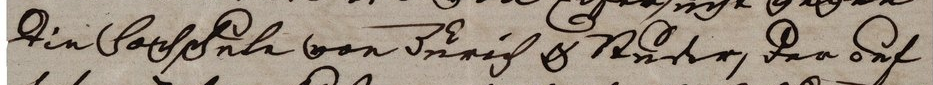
die Hochschule von Zürich & Studer, der auf
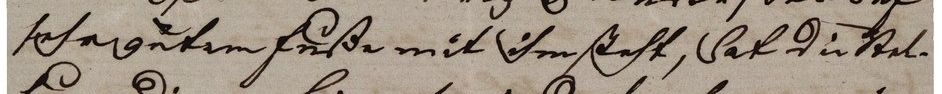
sehr gutem Fuße mit ihm steht, hat die Stel-
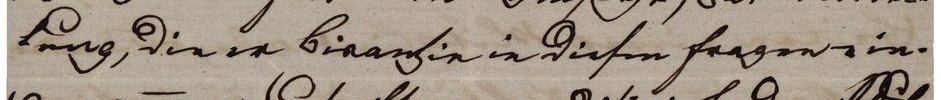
lung, die er bisanhin in diesen Fragen ein-
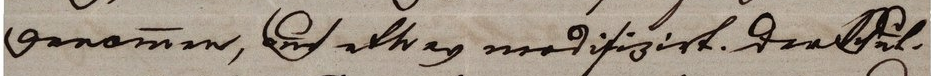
genommen, auch etwas modifizirt. Der Schul-
